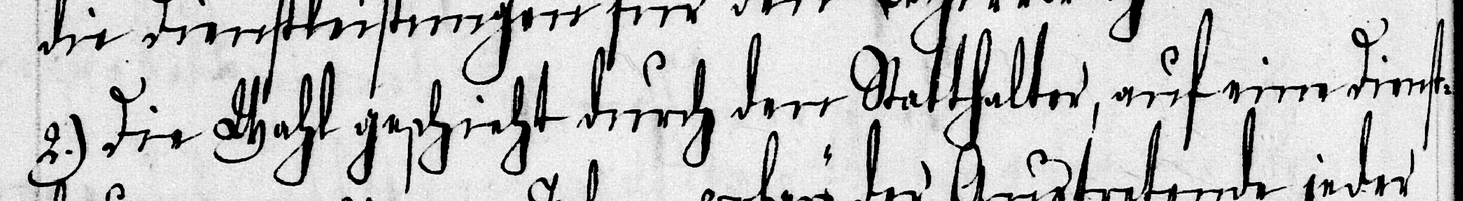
2.) Die Wahl geschieht durch den Statthalter, auf eine Dien¬
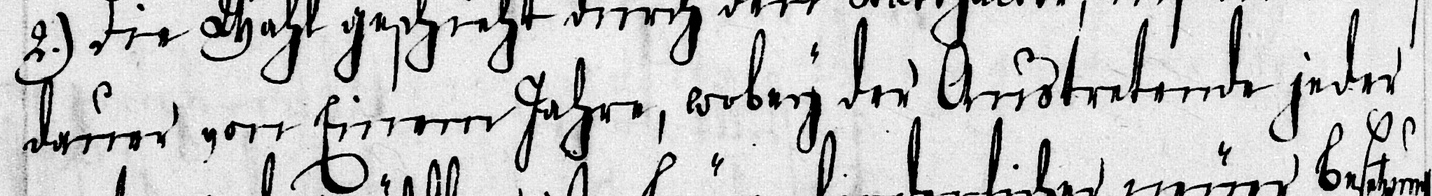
dauer von Einem Jahre, wobey der Austretende jeder
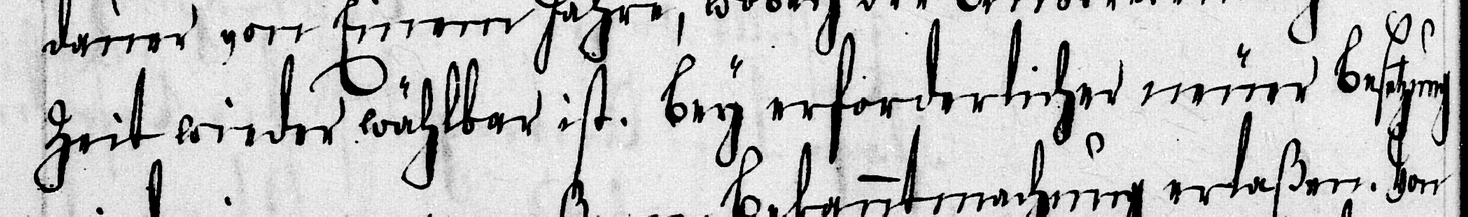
Zeit wieder wählbar ist. Bey erforderlicher neuer Besetz¬
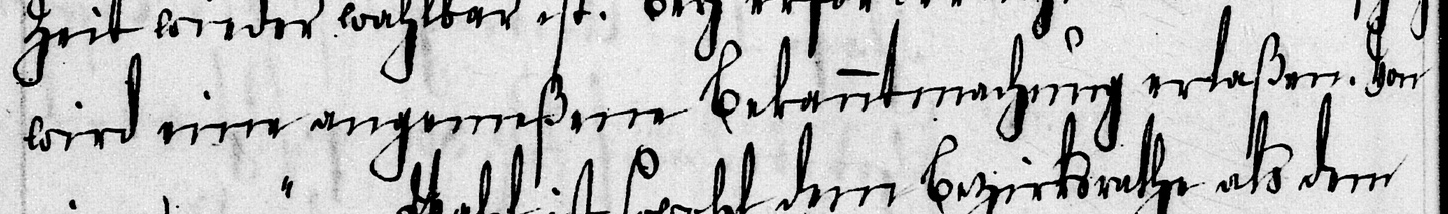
wird eine angemeßene Bekanntmachung erlaßen. Von
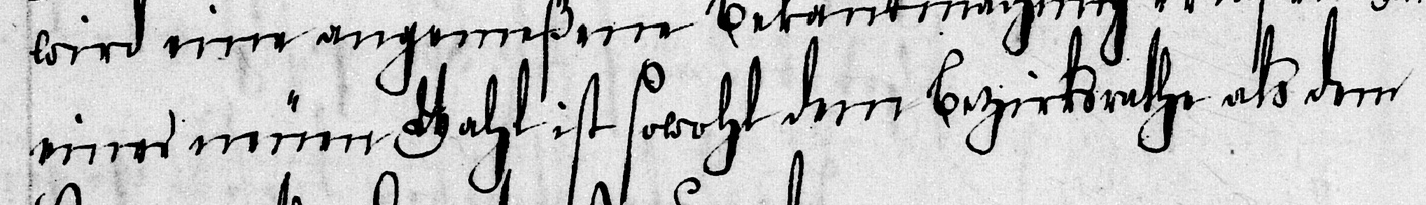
einer neuen Wahl ist sowohl dem Bezirksrathe als dem
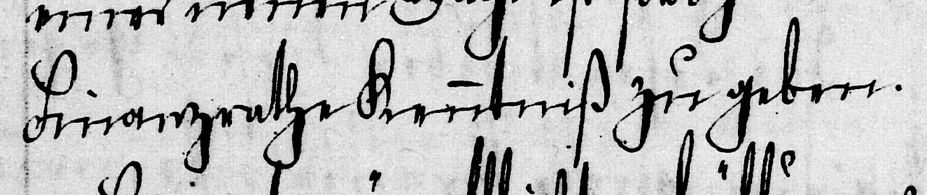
Finanzrathe Kenntniß zu geben.
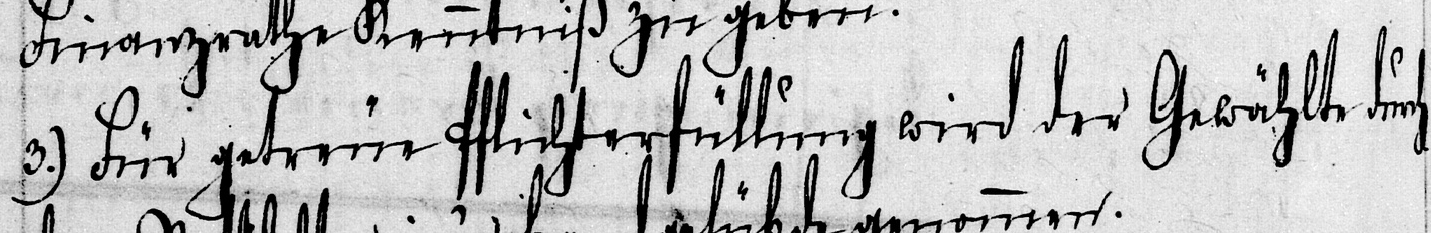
3.) Für getreue Pflichterfüllung wird der Gewählte
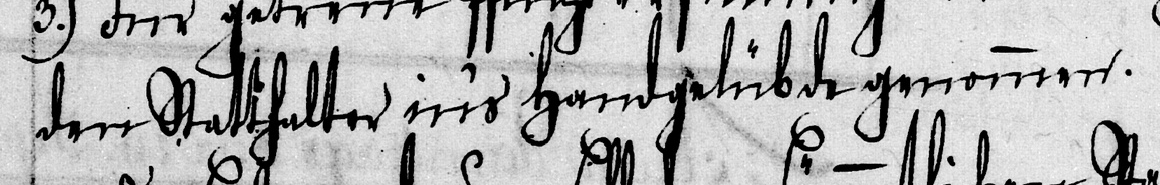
den Statthalter in’s Handgelübde genommen.
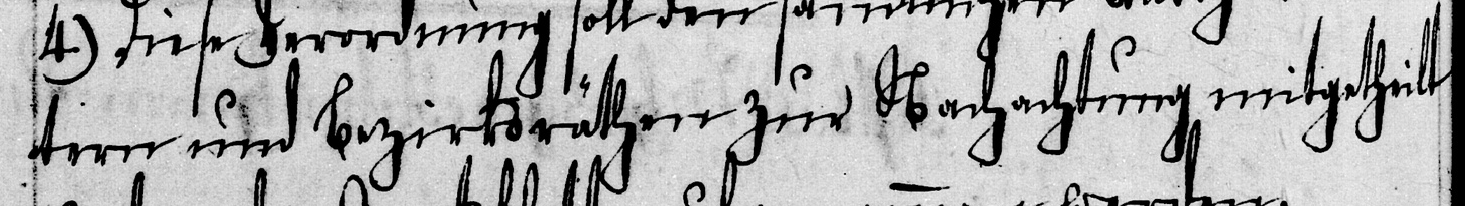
tern und Bezirksräthen zur Nachachtung mitgetheilt
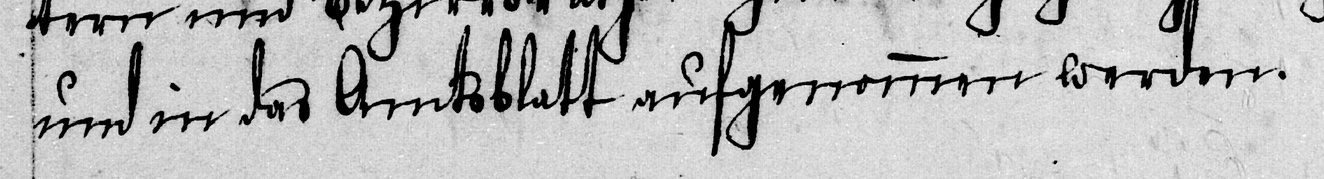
und in das Amtsblatt aufgenommen werden.
